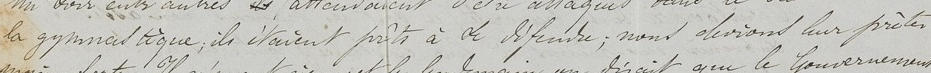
la gymnastique; ils étaient prêts à se défendre; nous devions leur prêter
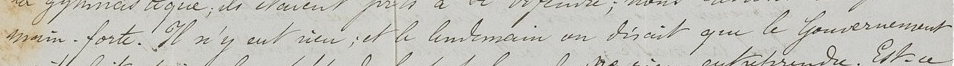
main-forte. Il n'y eut rien; et le lendemain on disait que le Gouvernement
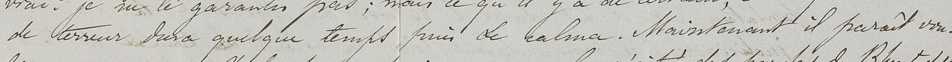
de terreur dura quelque temps puis se calma. Maintenant il paraît vou-
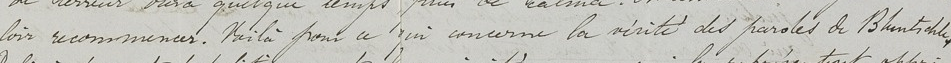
loir recommencer. Voilà pour ce qui concerne la vérité des paroles de Bluntschli.
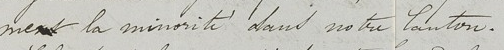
ment la minorité dans notre Canton.
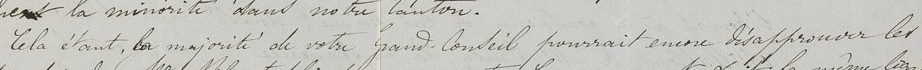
Cela étant, la majorité de votre Grand-Conseil pourrait encore désapprouver les
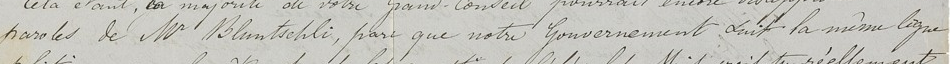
paroles de MrBluntschli, parce que notre Gouvernement suit la même ligne
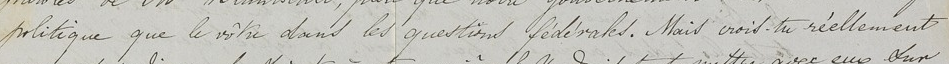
politique que le vôtre dans les questions fédérales. Mais crois-tu réellement
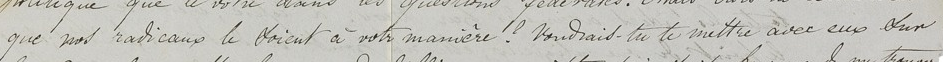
que nos radicaux le soient à votre manière? Voudrais-tu te mettre avec eux sur
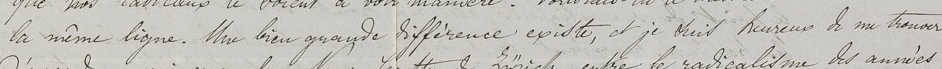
la même ligne. Une bien grande différence existe, et je suis heureux de me trouver
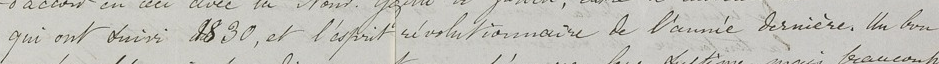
qui ont suivi 1830, et l'esprit révolutionnaire de l'année dernière. Un bon
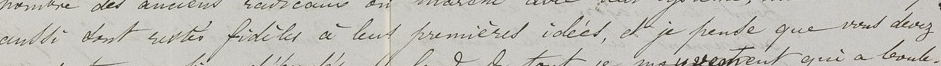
aussi sont restés fidèles à leurs premières idées, et je pense que vous devez
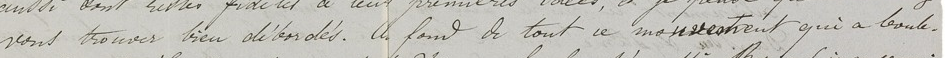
vous trouver bien débordés. Au fond de tout ce mouvement qui a boule-
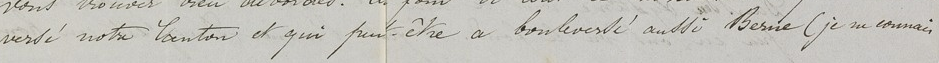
versé notre Canton et qui peut-être a bouleversé aussi Berne (je ne connais
